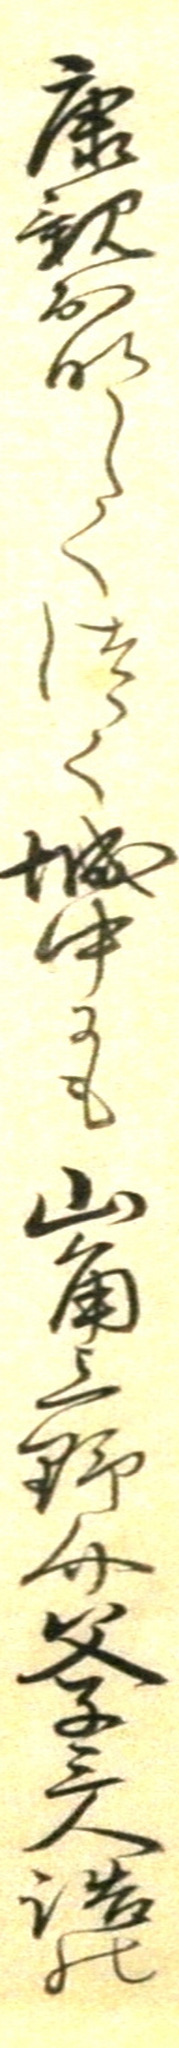康親おなしくつゝく城中にも山角上野介父子三人詰の
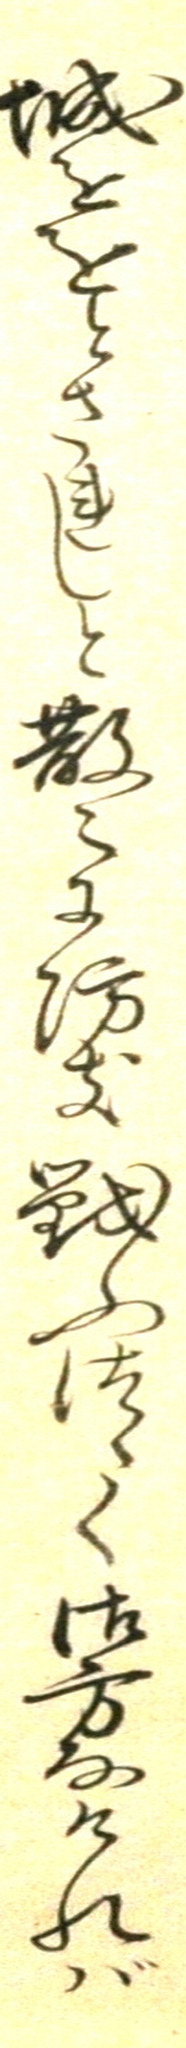城ををとされしと散々に防き戦ふつゝく御方なければ

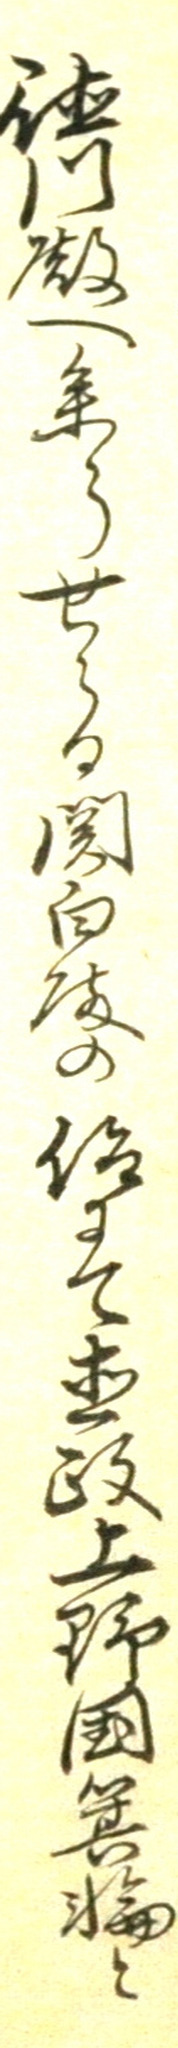徳川殿へ参らせらる関白殿の仰にて直政上野国箕輪と
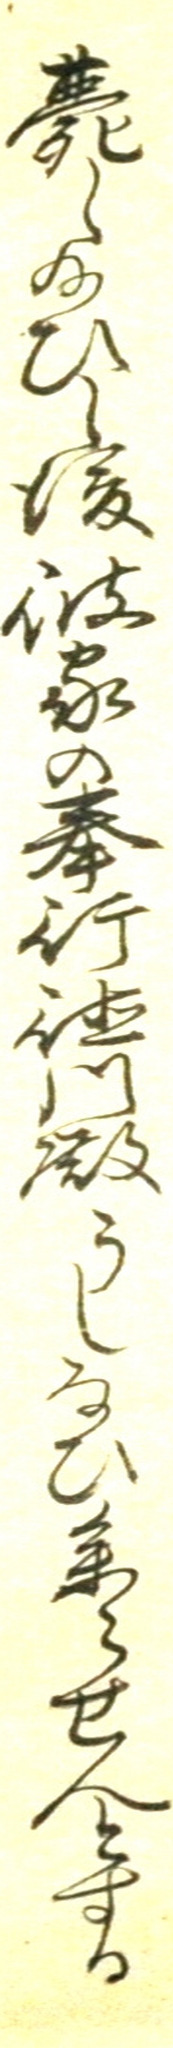薨し給ひし後彼家の奉行徳川殿うしなひ参らせんとする
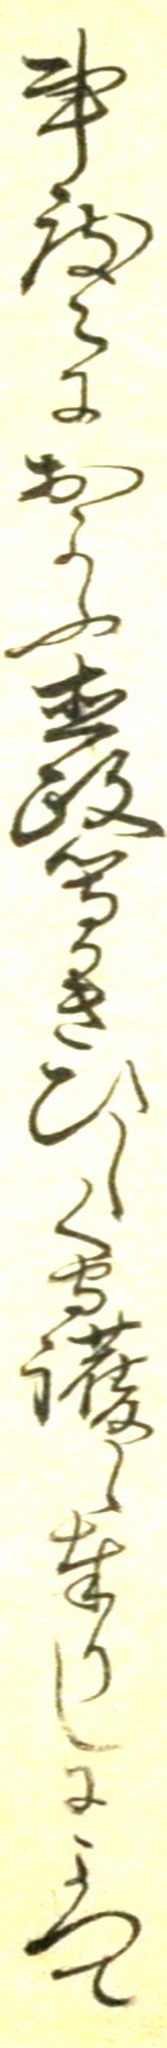事度々におよふ直政等かきひしく守護し奉りしによつて
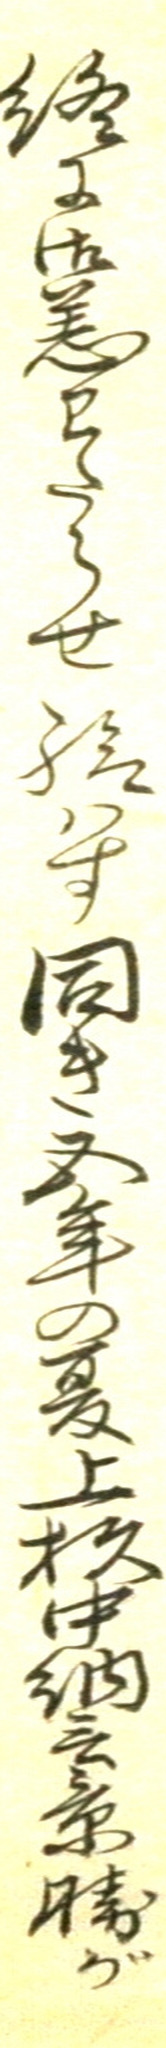終に御恙わたらせ給はす同き五年の夏上杉中納言景勝が
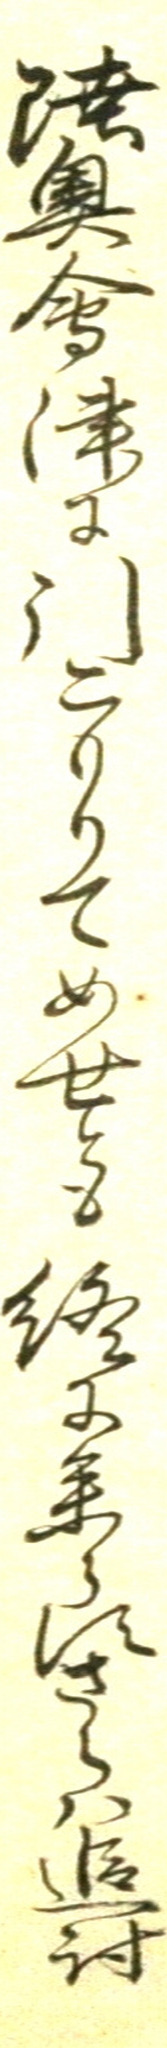陸奥会津に引こもりてめせとも終に参らすさらは追討
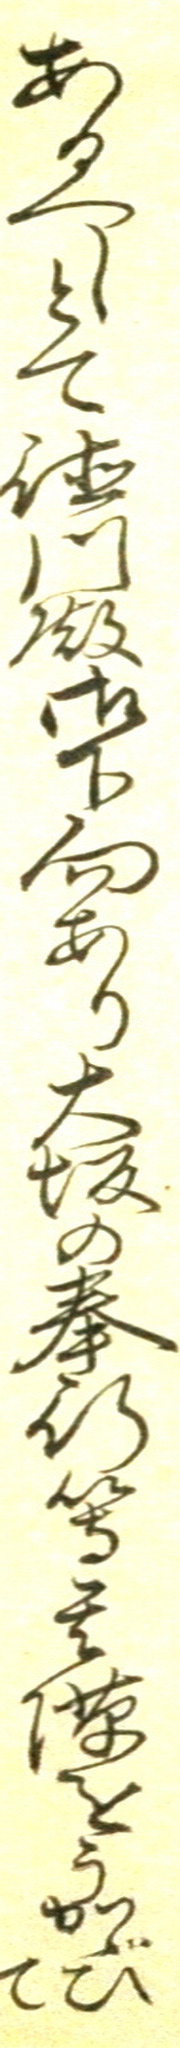あるへしとて徳川殿御下向あり大坂の奉行等其隙をうかゞひて
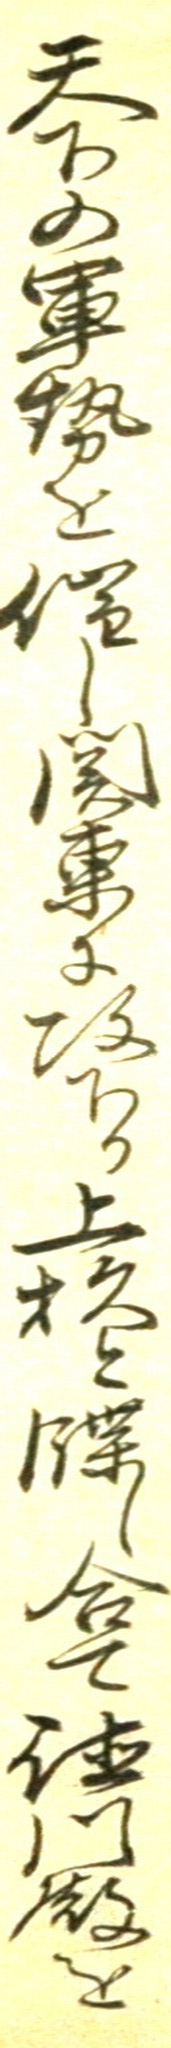天下の軍勢を催し関東に攻下り上杉と牒し合て徳川殿を
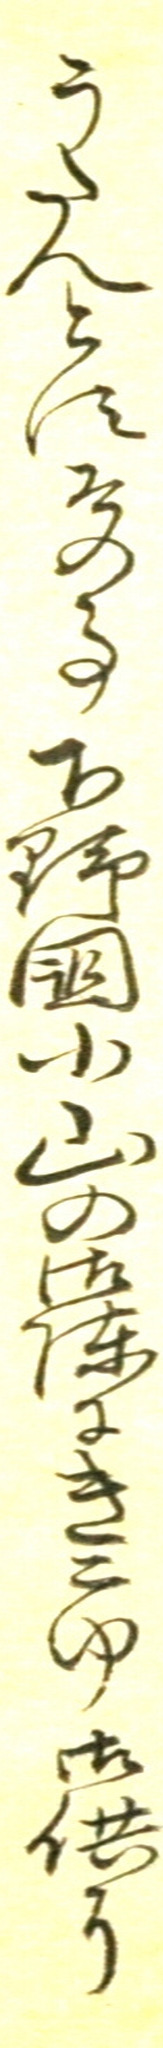うたんとすその事下野国小山の御陣にきこゆ御供に

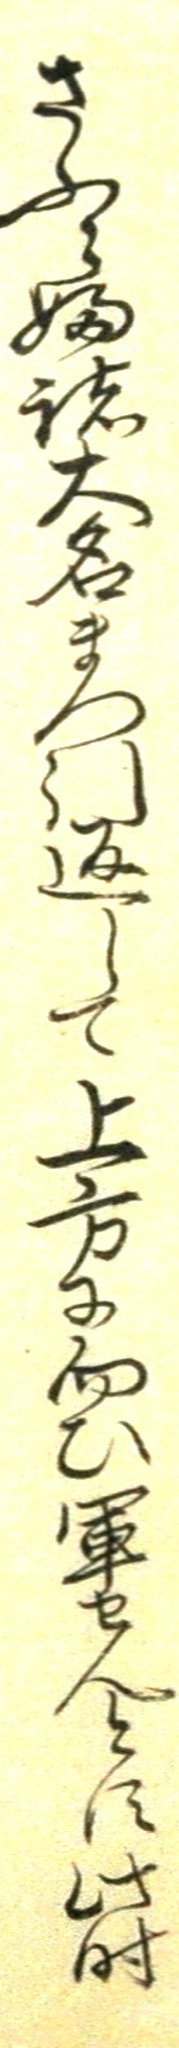さふらふ諸大名まつ引返して上方に向ひ軍せんとす此時
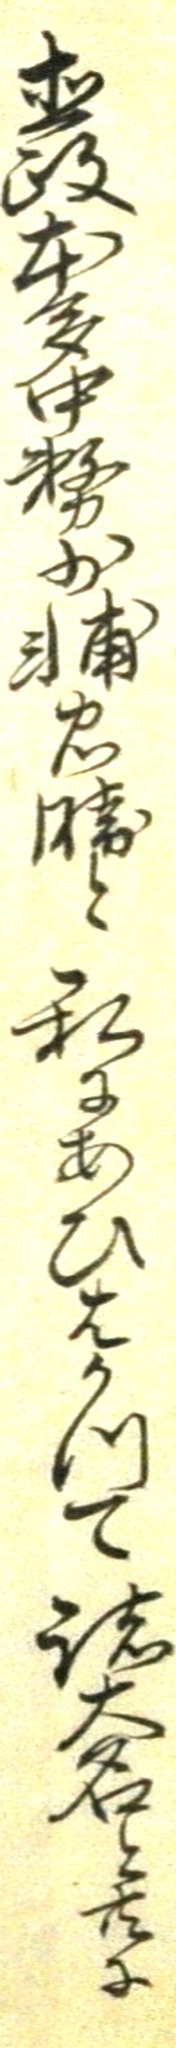直政本多中務少輔忠勝と私にあひはかつて諸大名と共に
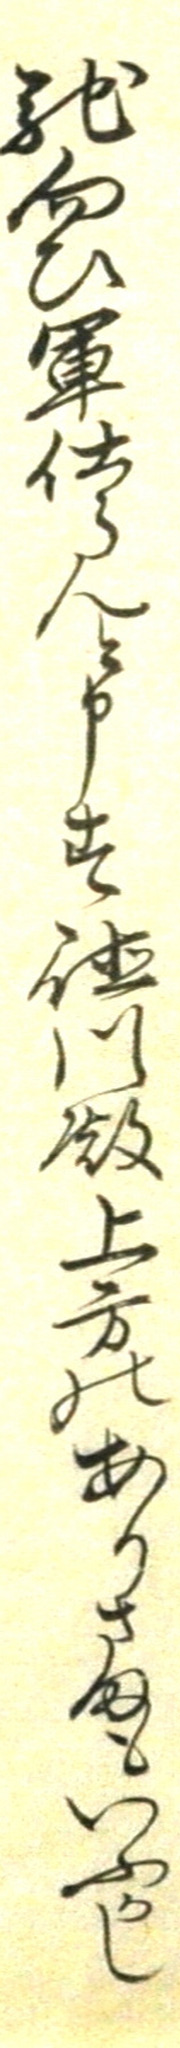馳向ひ軍仕らんと申す徳川殿上方のありさまもいふかし
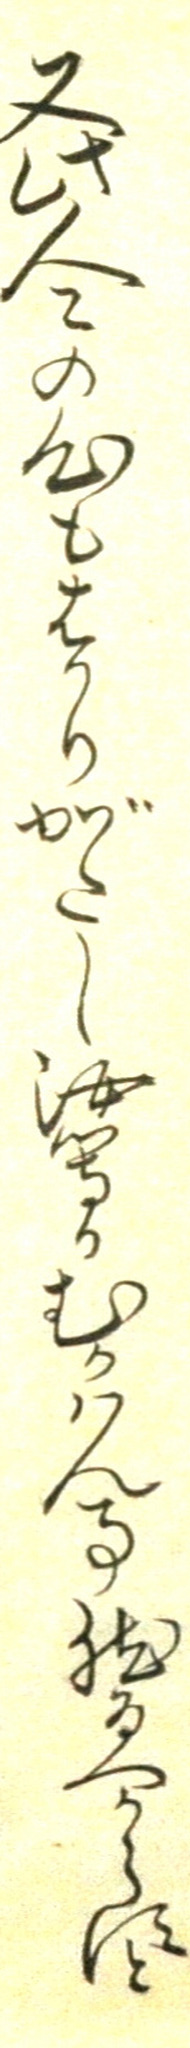又此人々の心もはかりがたし汝等かむかはん事然るへからすと
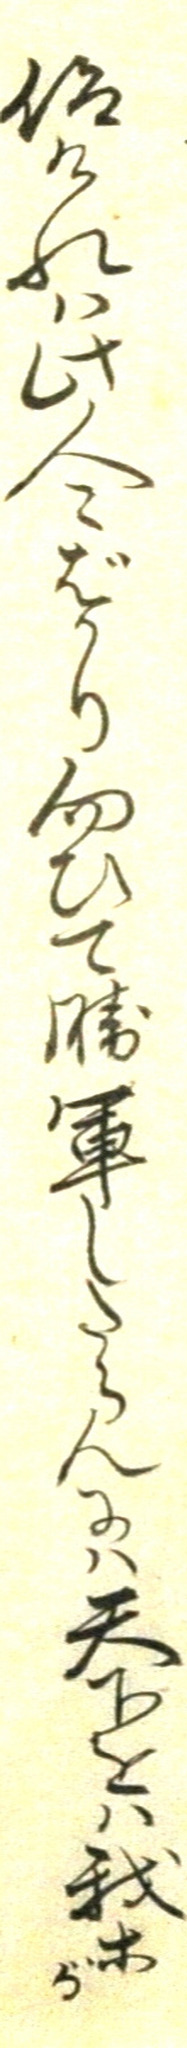仰けれは此人々ばかり向ひて勝軍したらんには天下をは我等が
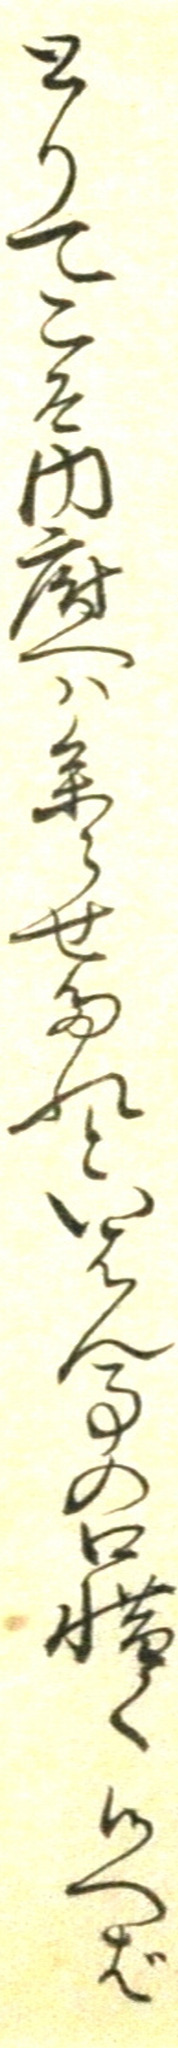とりてこそ内府へは参らせたれといはん事の口惜く候へば
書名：藩翰譜（四・上）
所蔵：伊那市立高遠町図書館・合同会社AMANE
